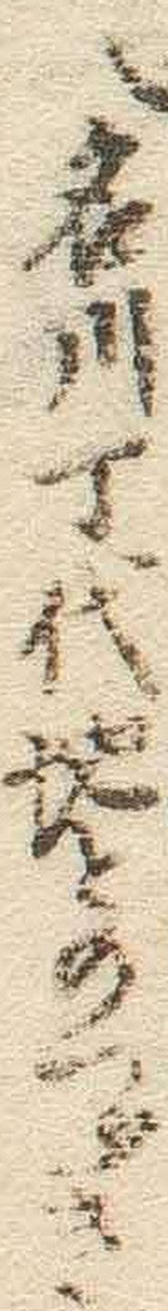八名川丁代地とのつゞき
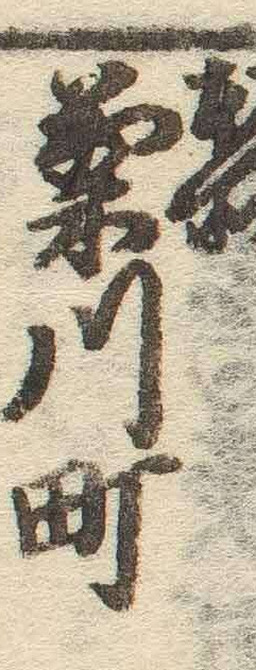菊坂町
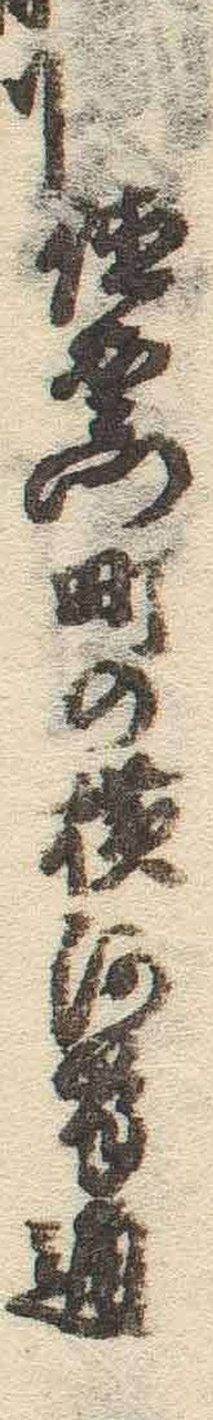徳右衛門町の横河岸通
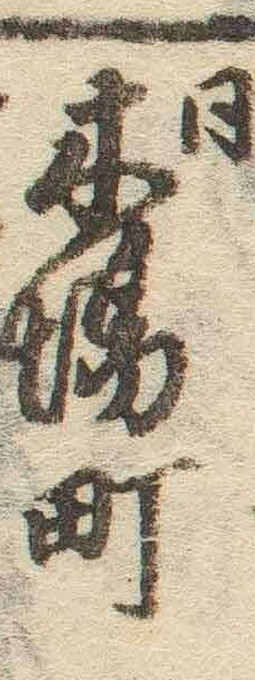木場町
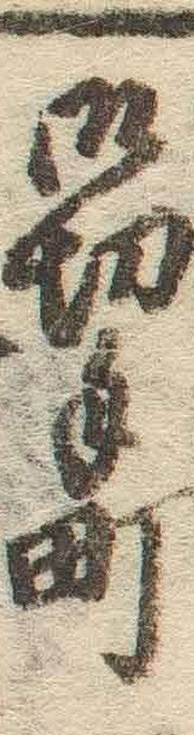御切手町
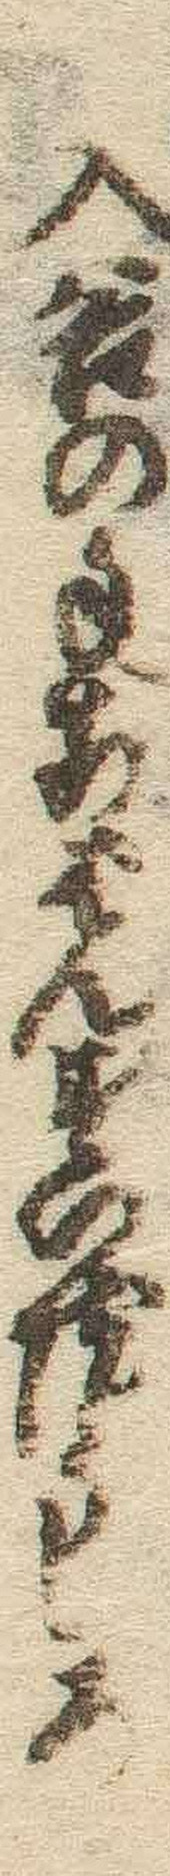入谷の手前ばんすい院うしろ

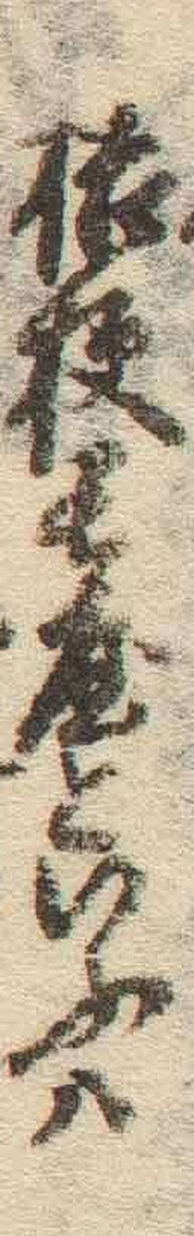桔梗長屋といふは
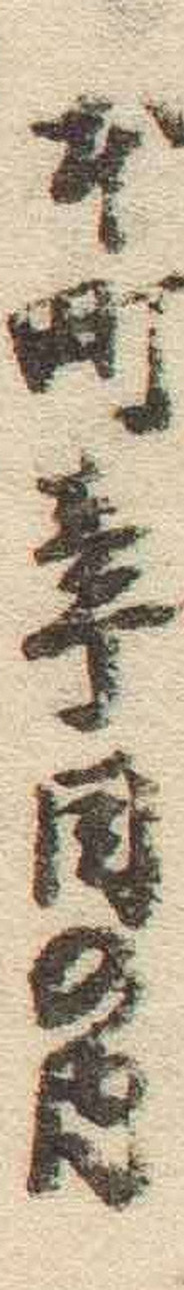本町壱丁目の内
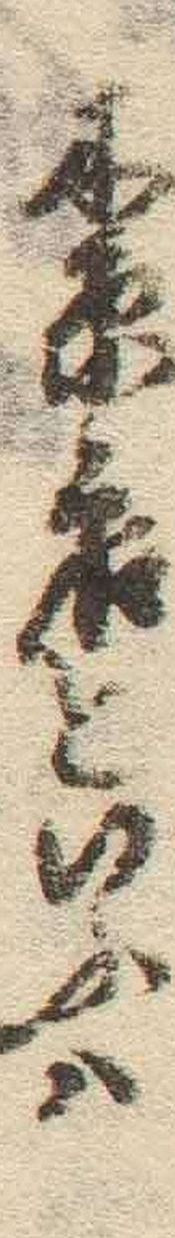木原店といふは
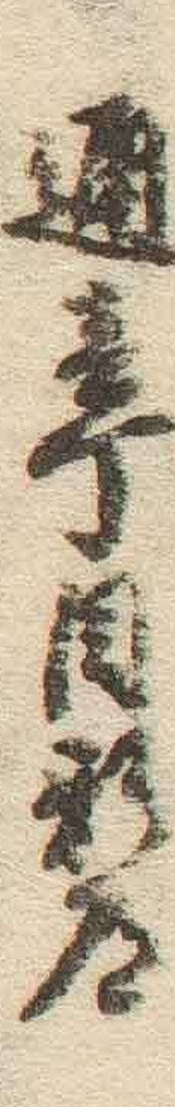通壱丁目新道
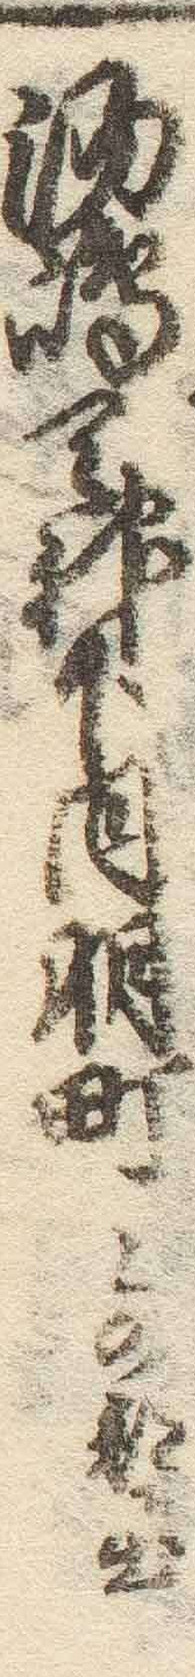湯島天神下同朋町との部に出
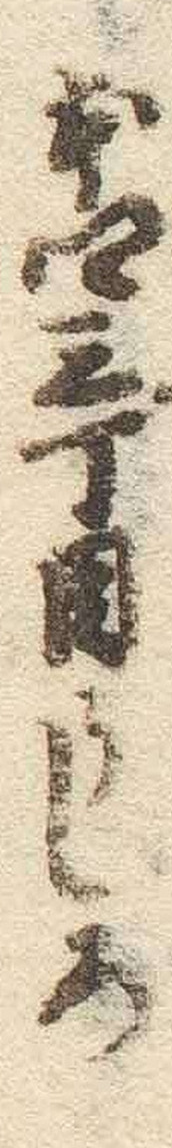本郷三丁目うしろ
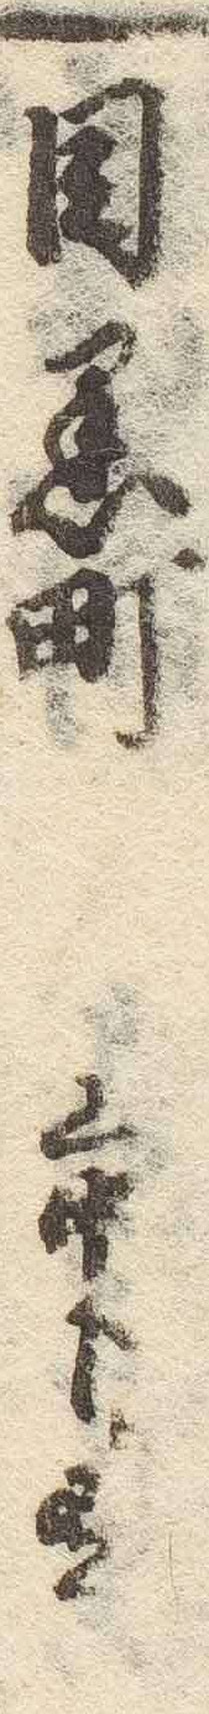目黒町上中下ト有
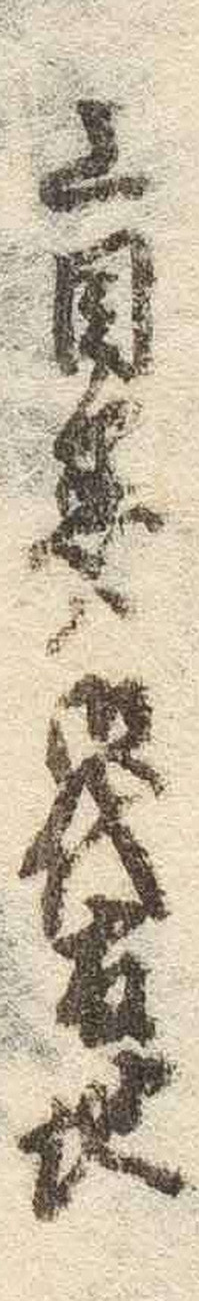上目黒は御代官地
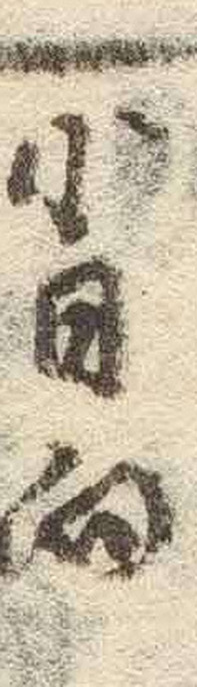小日向
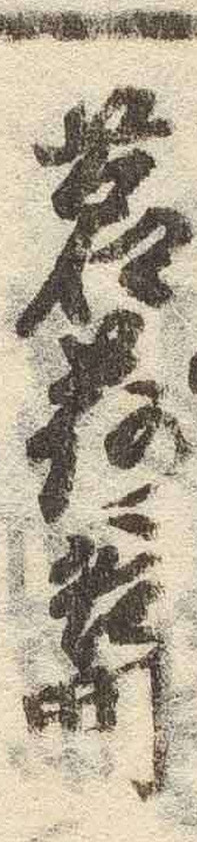茗荷谷町
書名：江戸町独案内
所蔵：東京学芸大学附属図書館 国文学研究資料館
